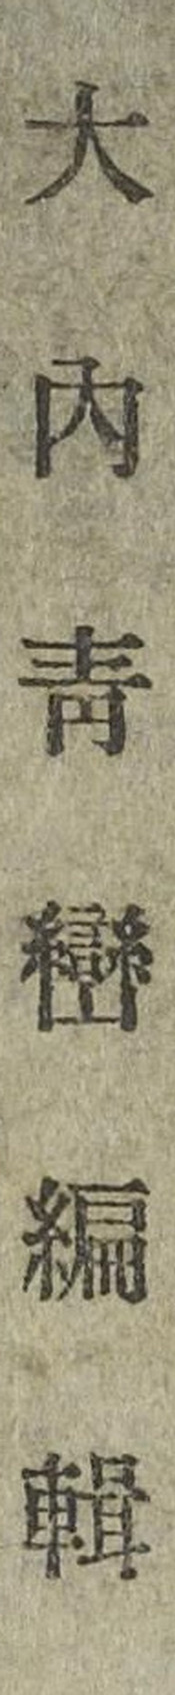大内青巒編輯
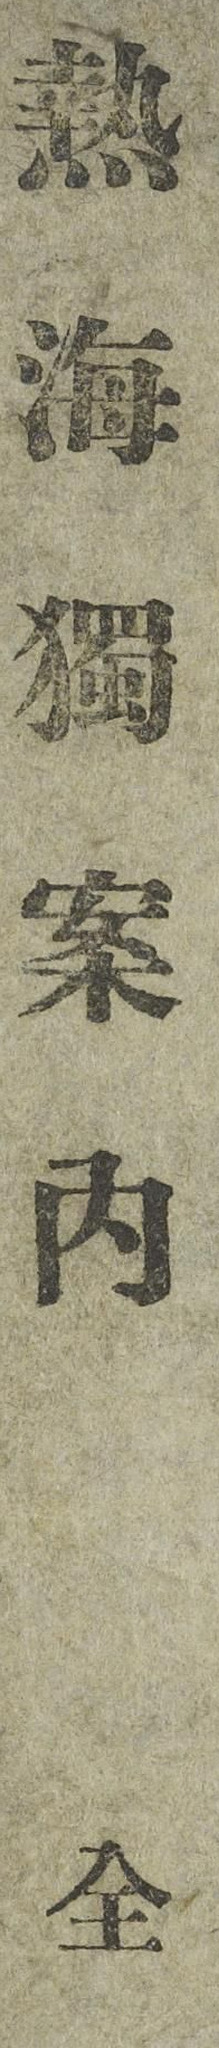熱海獨案内全

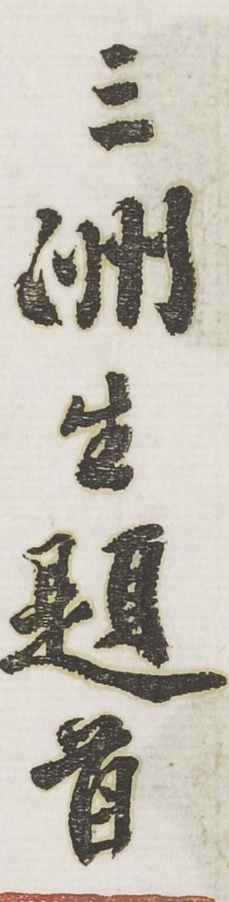三州生題首
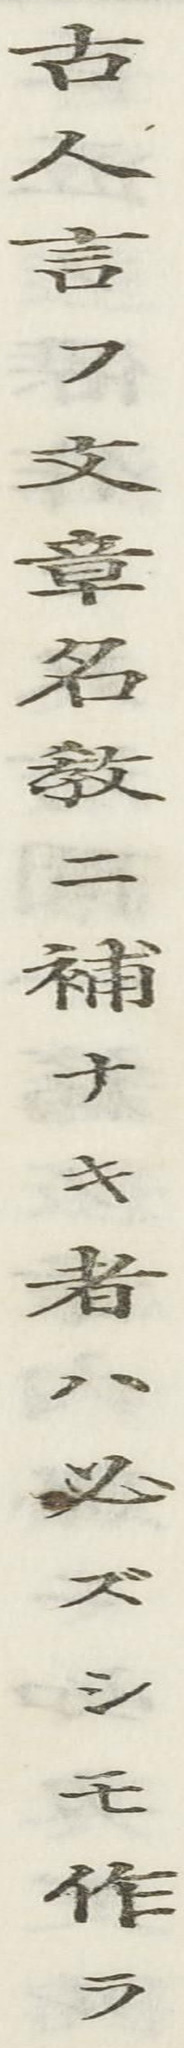古人言フ文章名教ニ補ナキ者ハ必ズシモ作ラ
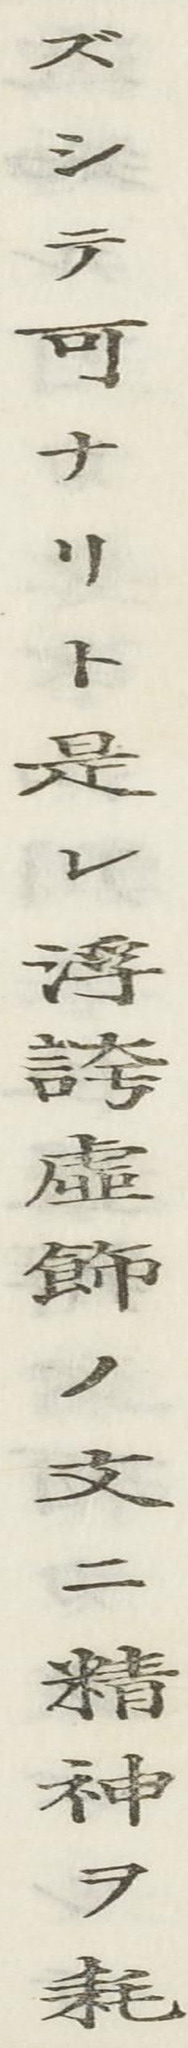ズシテ可ナリト是レ浮誇虚飾ノ文ニ精神ヲ耗
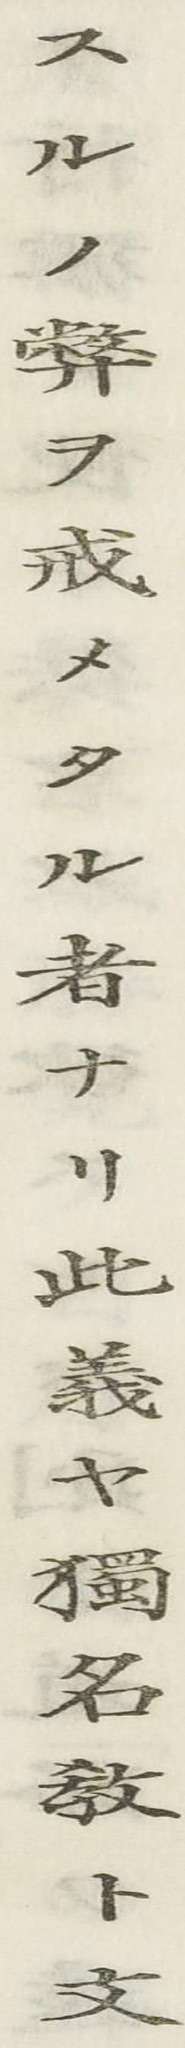スルノ弊ヲ戒メタル者ナリ此義ヤ独名教ト文
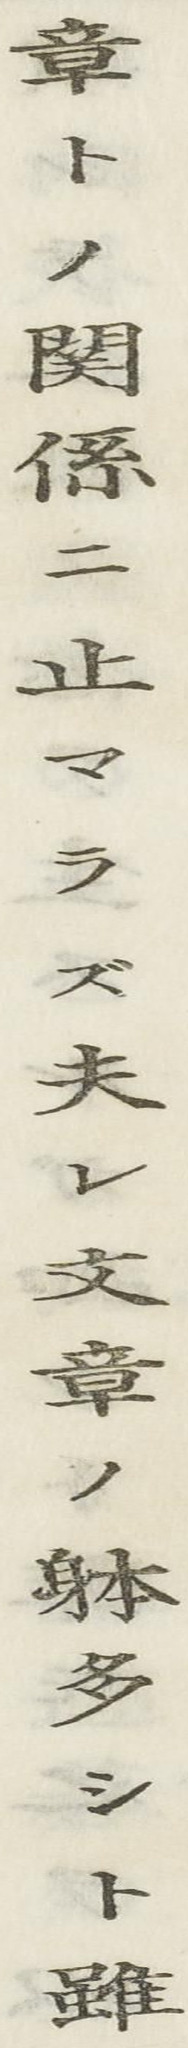章トノ関係ニ止マラズ夫レ文章ノ体多シト雖
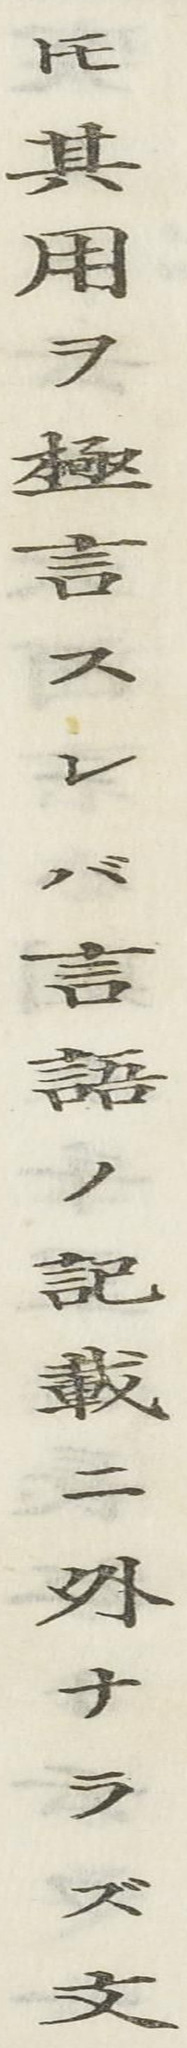トモ其用ヲ極言スレバ言語ノ記載ニ外ナラズ文
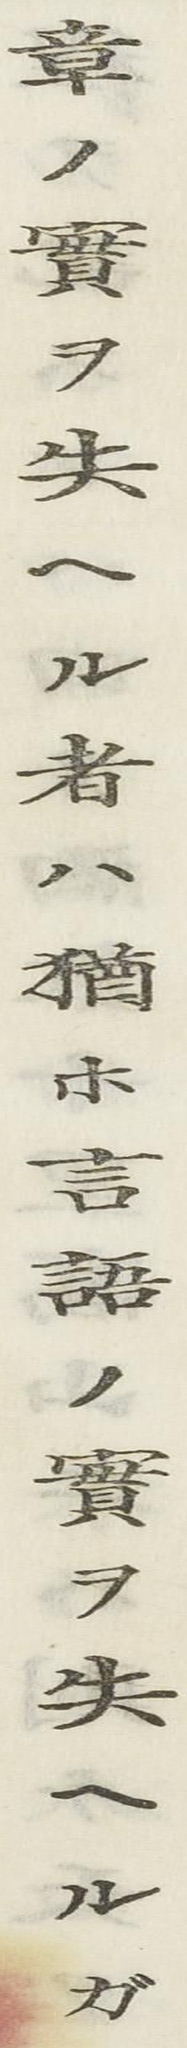章ノ実ヲ失ヘル者ハ猶ホ言語ノ実ヲ失ヘルガ
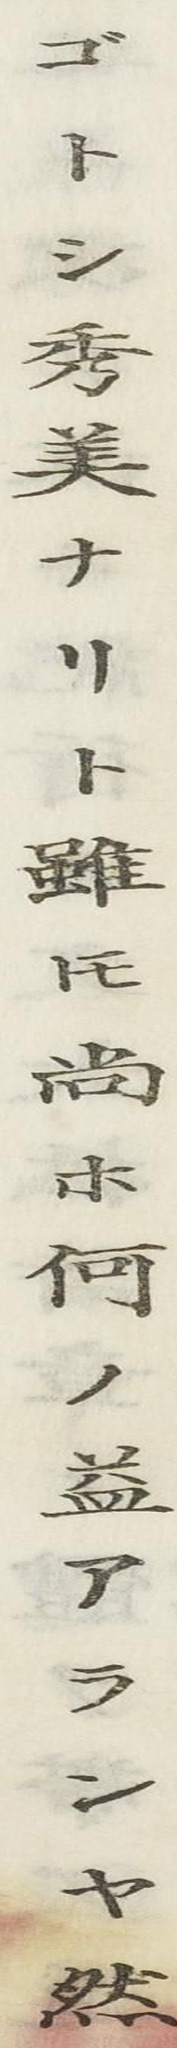ゴトシ秀美ナリト雖トモ尚ホ何ノ益アランヤ然
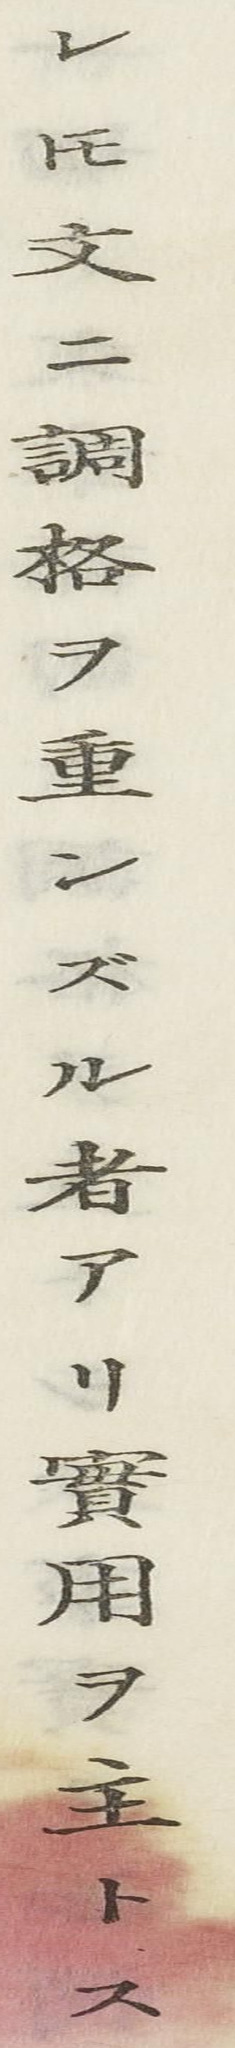レトモ文ニ調格ヲ重ンズル者アリ実用ヲ主トス
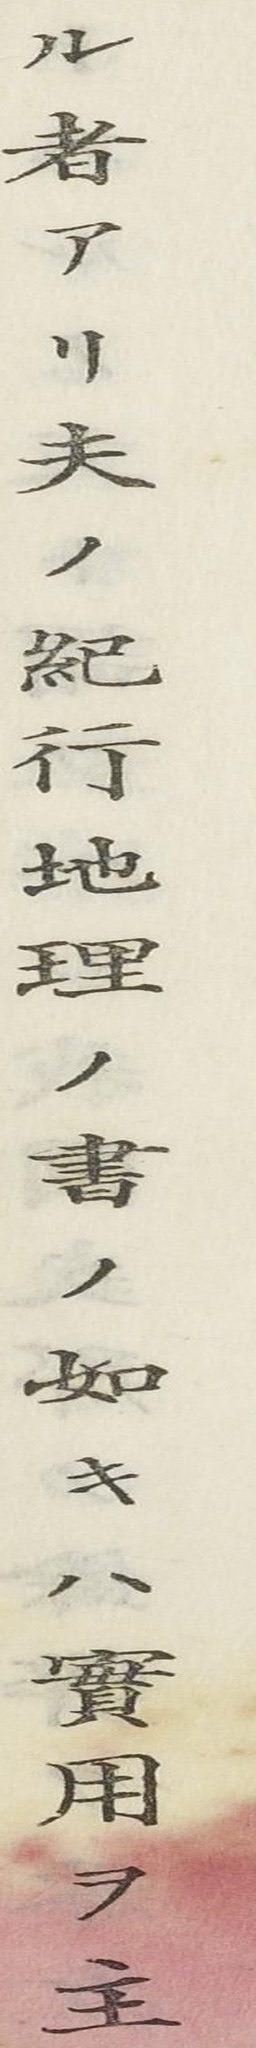ル者アリ夫ノ紀行地理ノ書ノ如キハ実用ヲ主

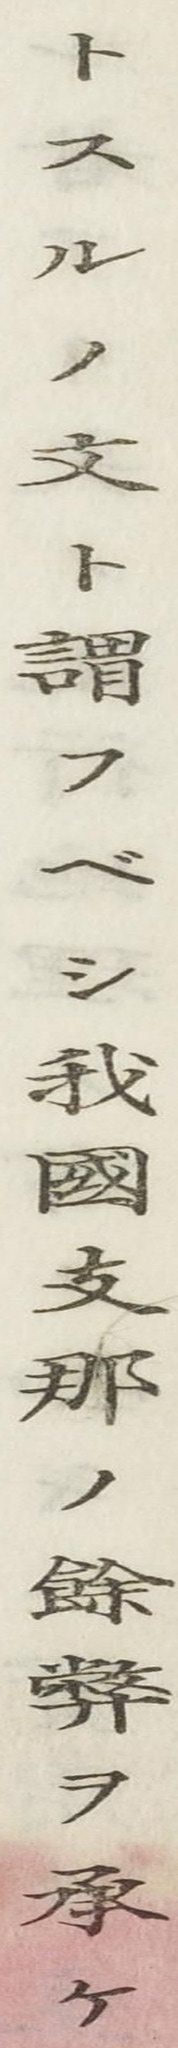トスル文ト謂フベシ我国支那ノ余弊ヲ承ケ
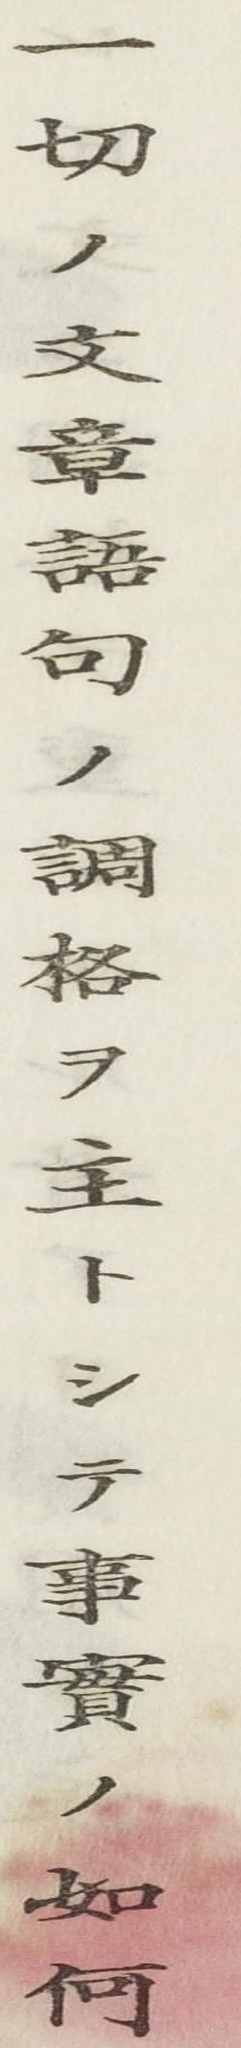一切ノ文章語句ノ格調ヲ主トシテ事実ノ如何
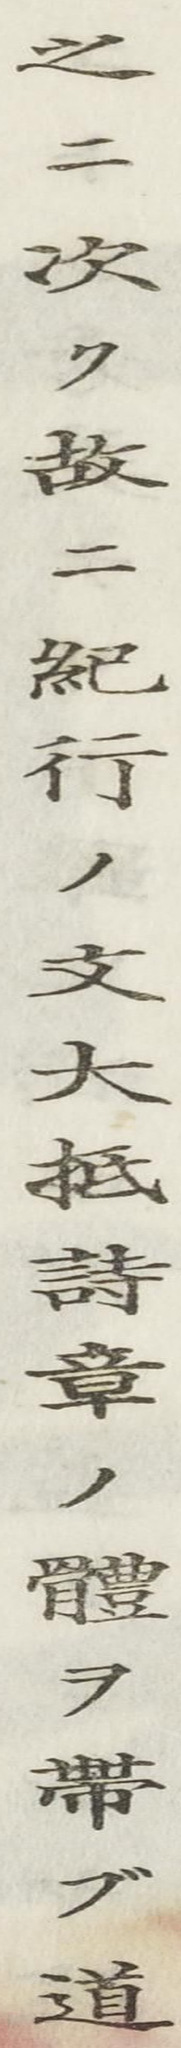之ニ次ク故ニ紀行ノ文大抵詩章ノ体ヲ帯ブ道
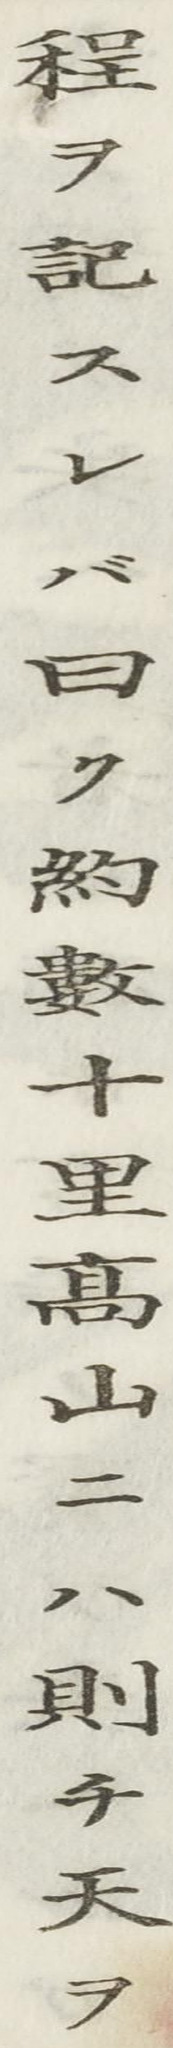程ヲ記スレバ曰ク約数十里高山ニハ即チ天ヲ
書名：熱海獨案内　全
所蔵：東京大学地震研究所図書室 Earthquake Research Institute Library, The University of Tokyo, JAPAN
